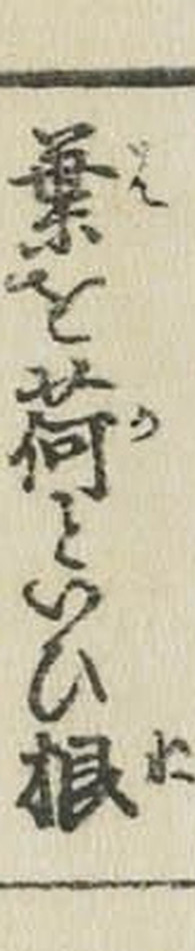葉を荷といひ根
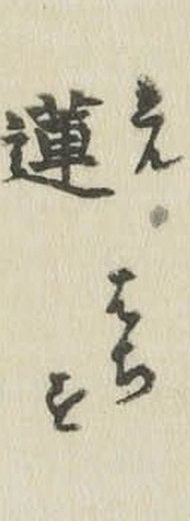蓮はちす
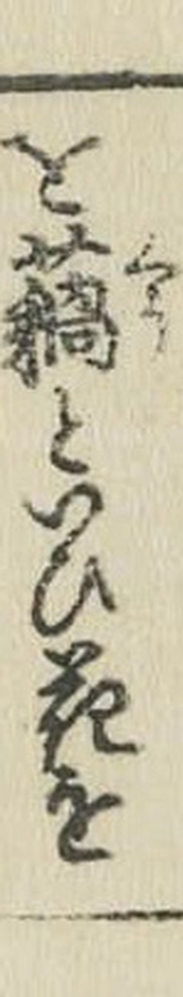を藕といひ花を
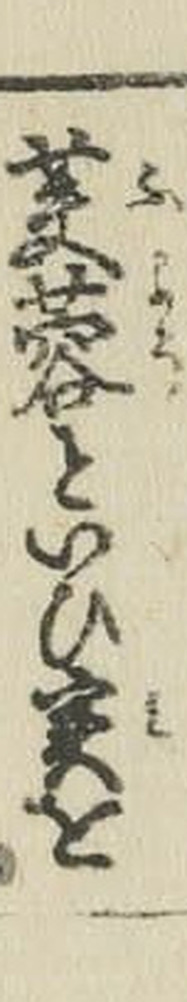芙蓉といひ実を
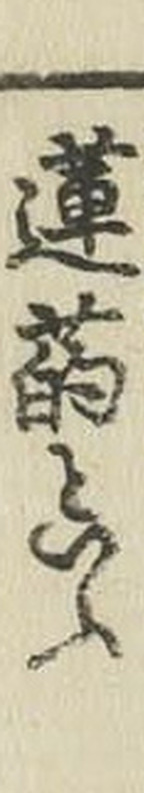蓮菂といふ
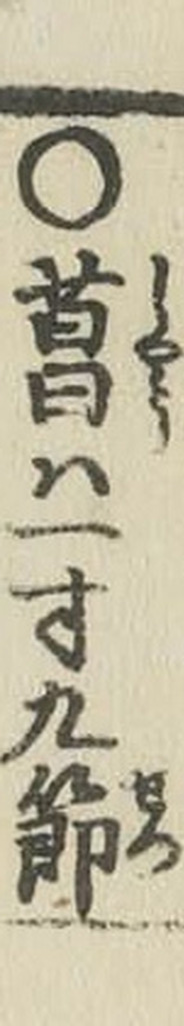○菖は一寸九節
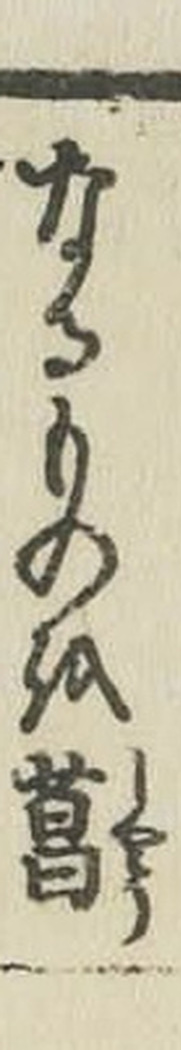なるものを菖
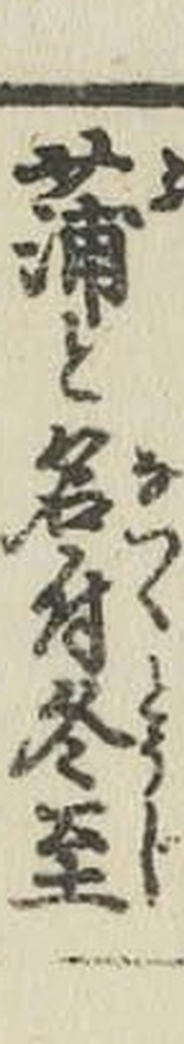蒲と名付冬至
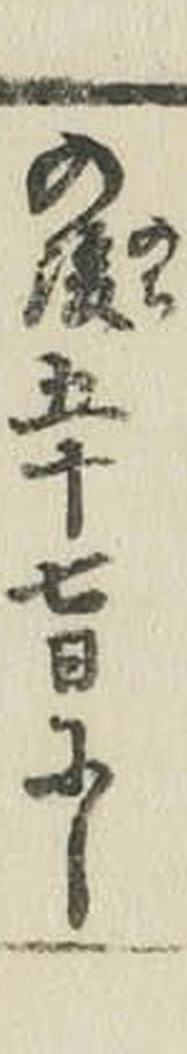の後五十七日にし
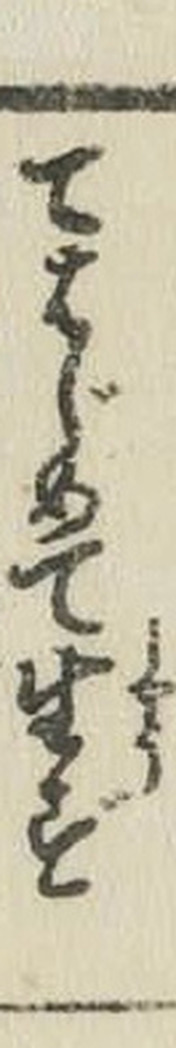てはじめて生ず
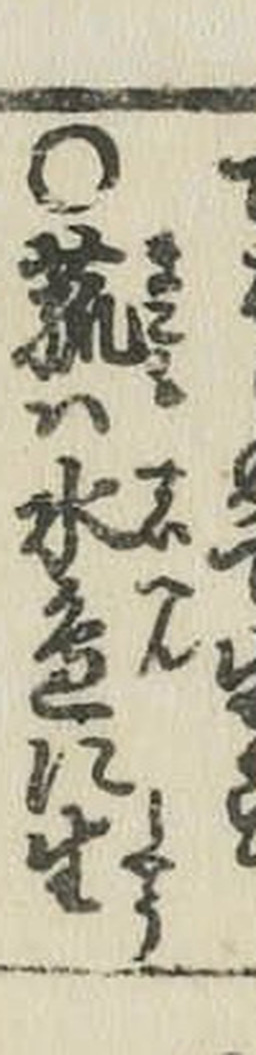○菰は水辺に生
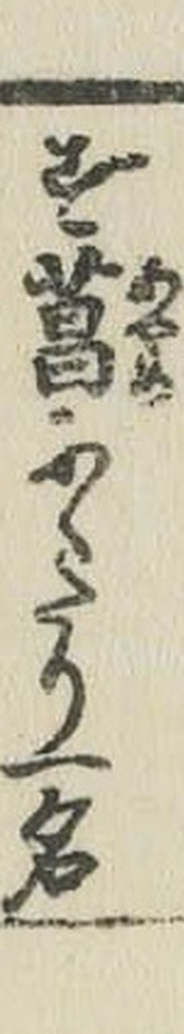ず菖にゝたり一名
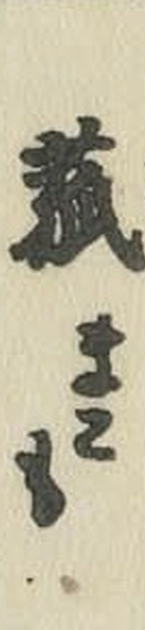菰まこも
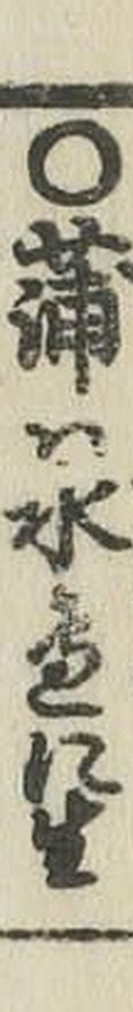○蒲は水辺に生
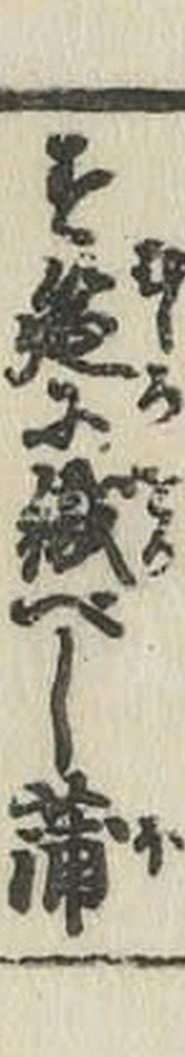す筵に織べし蒲
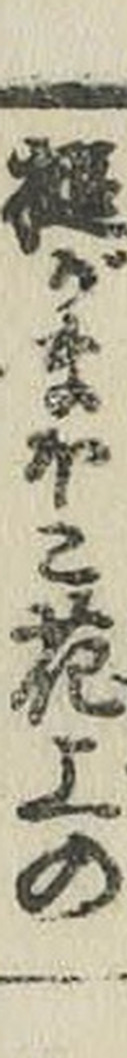槌がまほこ花上の
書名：増補頭書訓蒙図彙大成 10巻 9:巻之20
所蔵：東京学芸大学教育コンテンツアーカイブ
